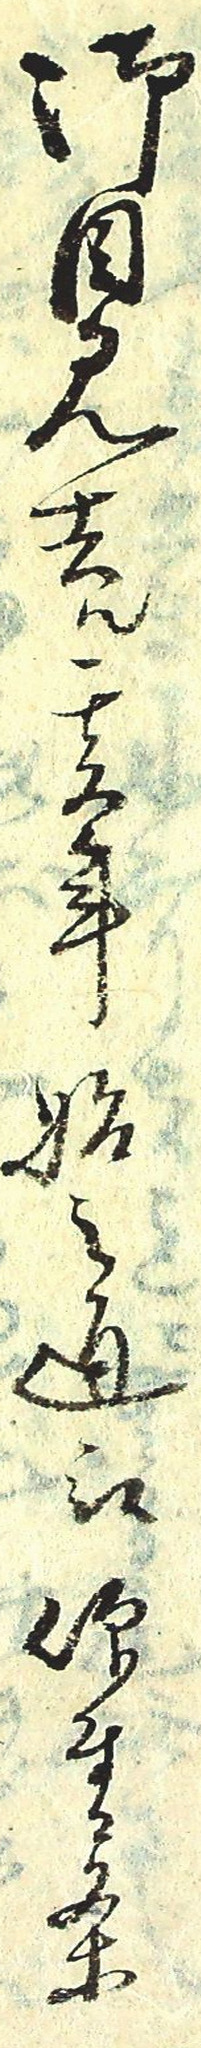御目見去る亥年始之通被仰付候条
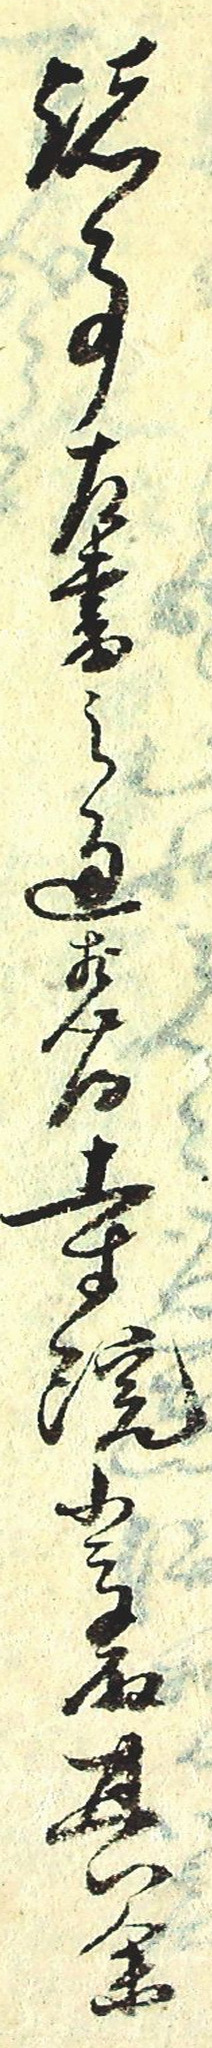諸事左書之通相心得寺院小高取其余
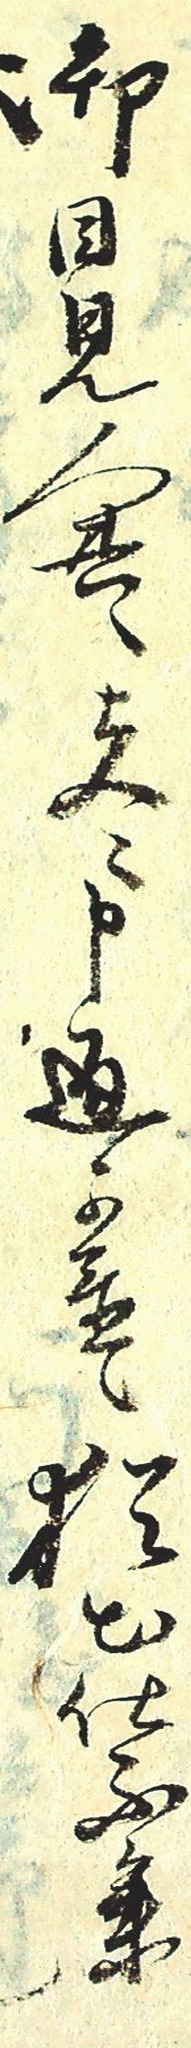御目見人共へ夫々申通可置候猶出仕不参
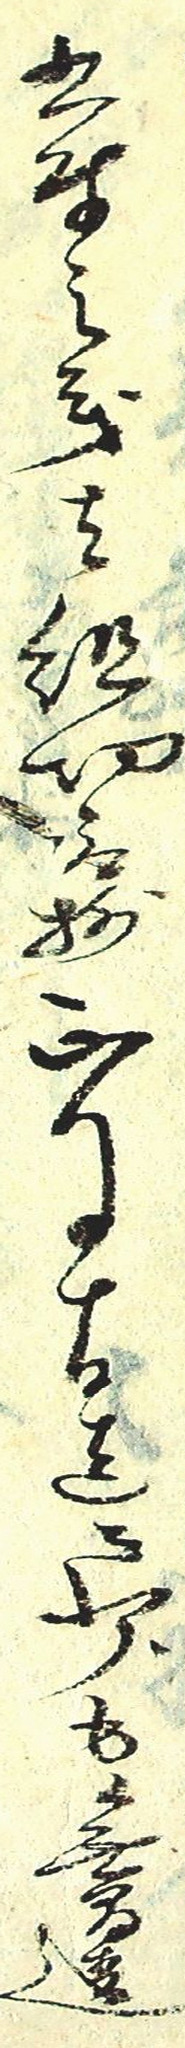書付之義は組切取揃正月十日迄に少も無間違
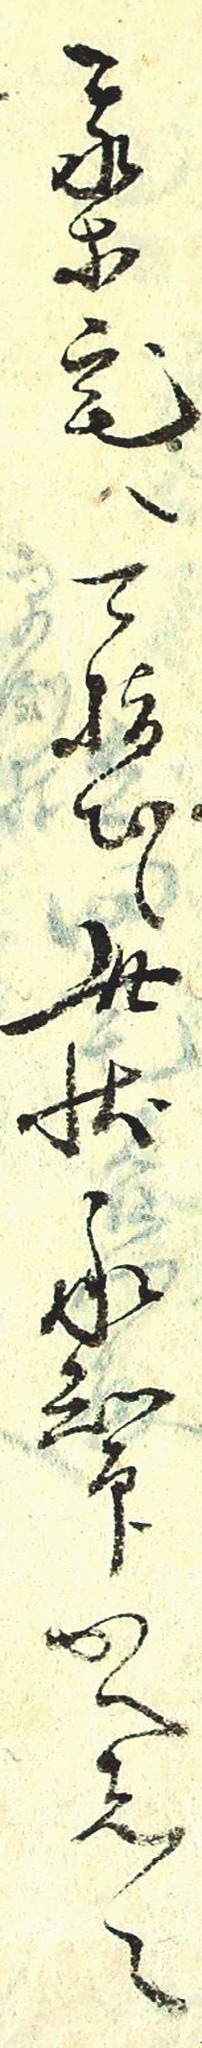我等宅へ可指出候此状承知印加へ先々
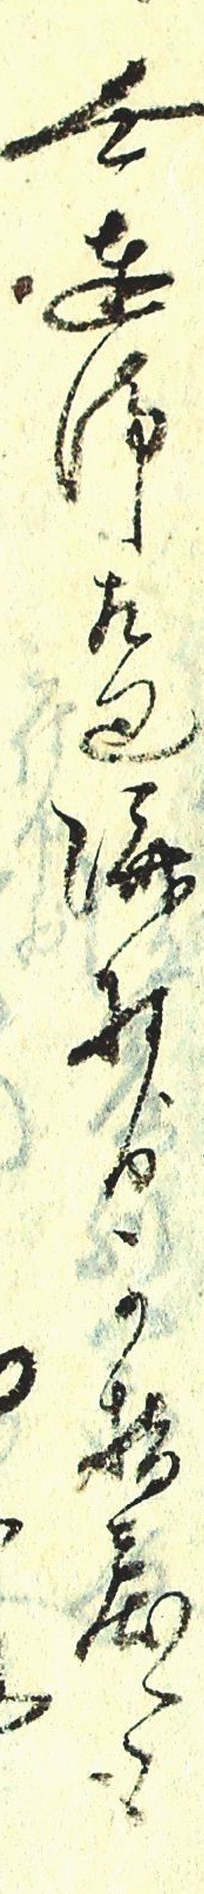無遅滞相廻済村ゟ可指戻候以上
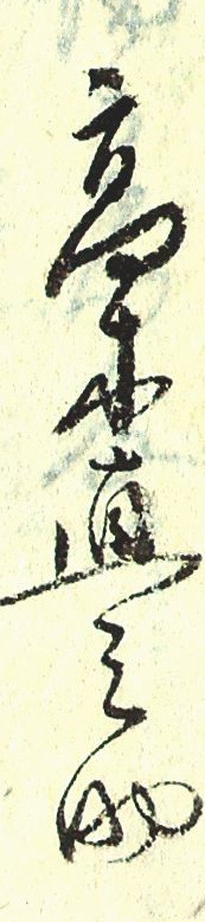高木直之助
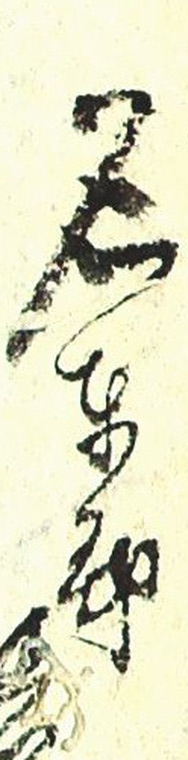名東郡
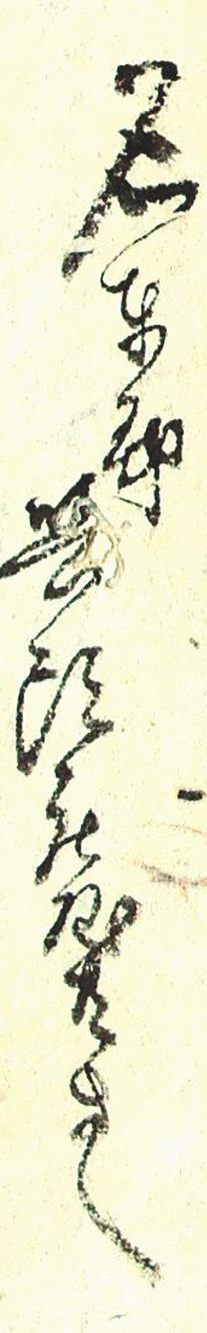与頭庄屋共方へ
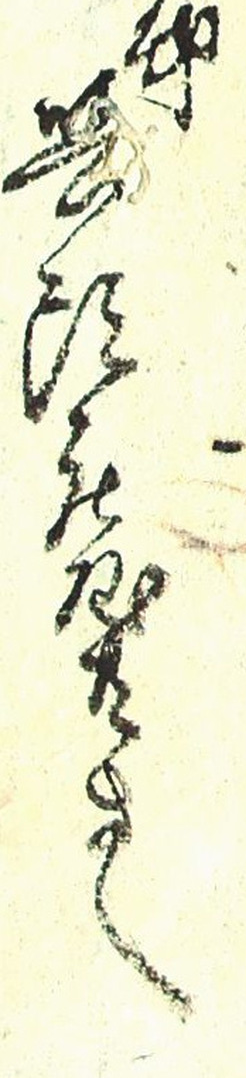与頭庄屋共方へ

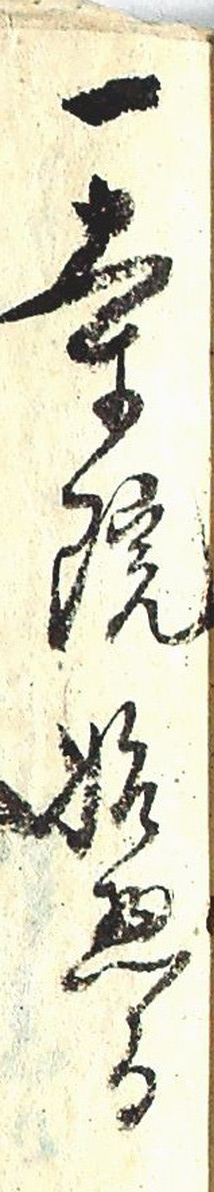一寺院始惣て
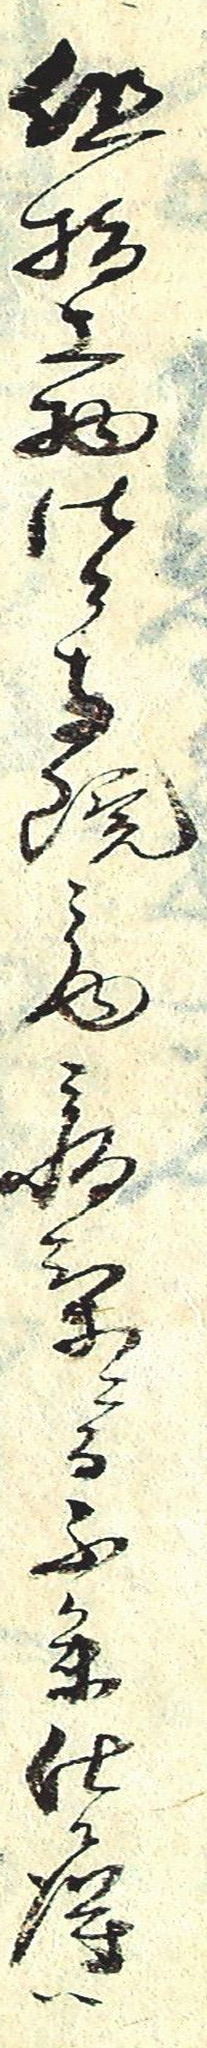但指上物仕候寺院之内病気にて不参仕候得は
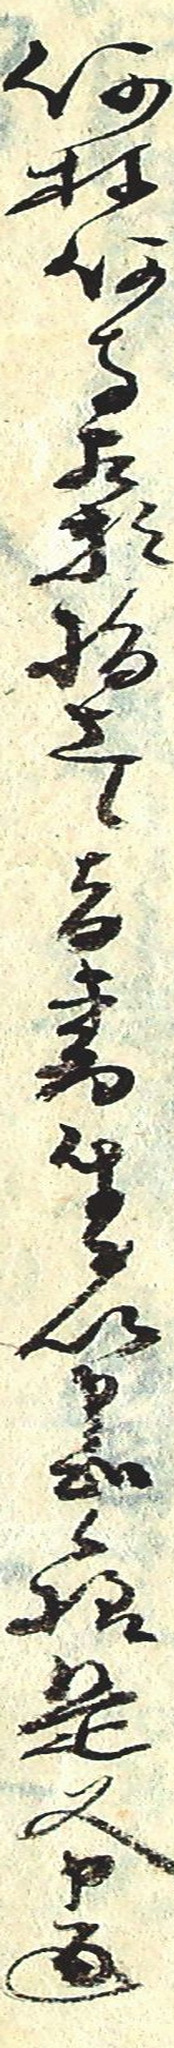何村何寺相頼指上候旨書付を以申出候様是又申通
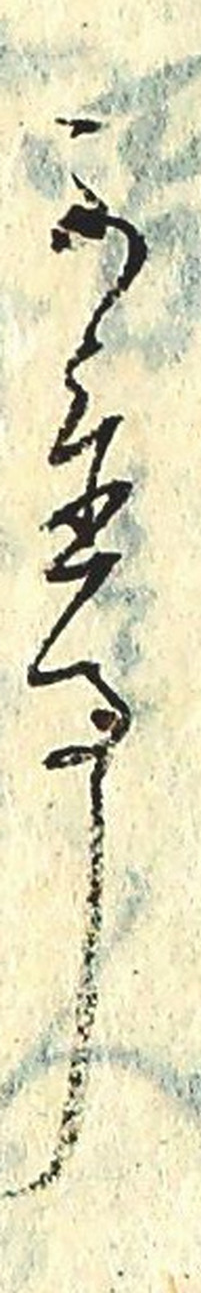可置事
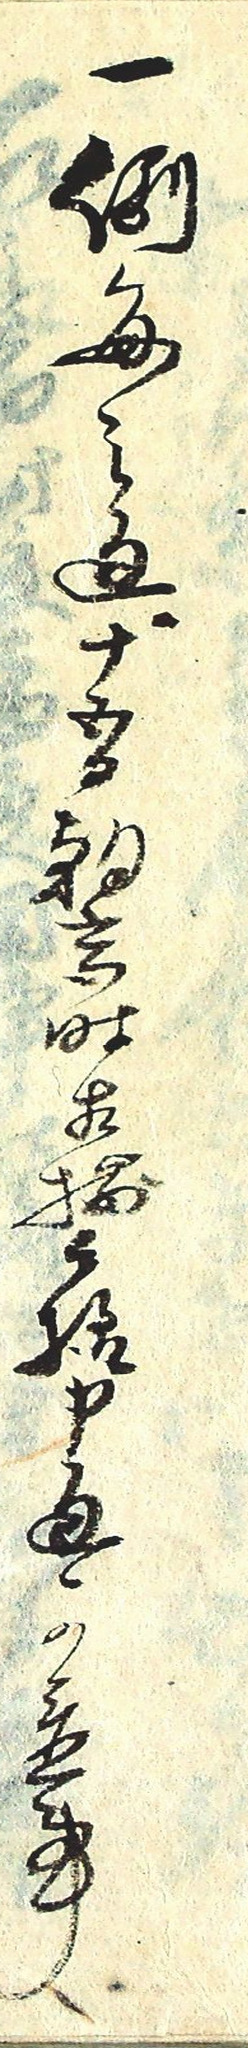一例毎之通十五日朝六つ時相揃候様申通可置事
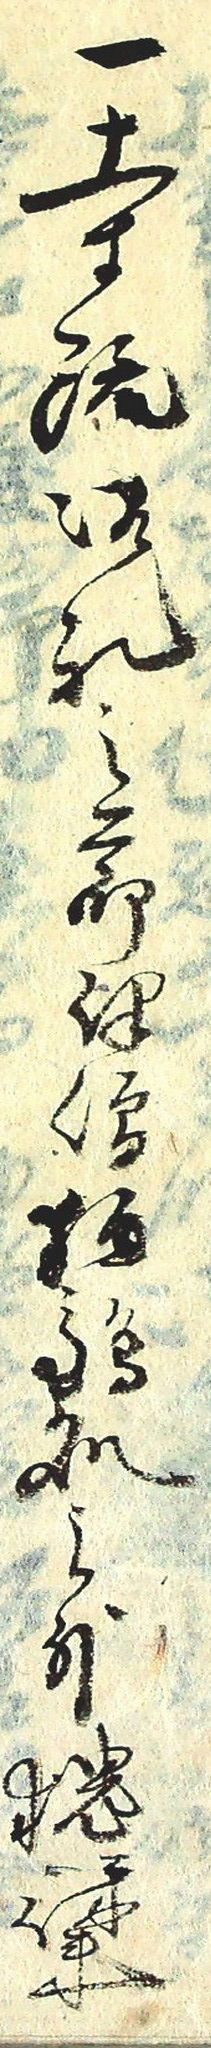一寺院御礼之節伴僧猶予処之外猥に休来
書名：諸御願書控(弐番）
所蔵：鳴門教育大学 Naruto University of Education
